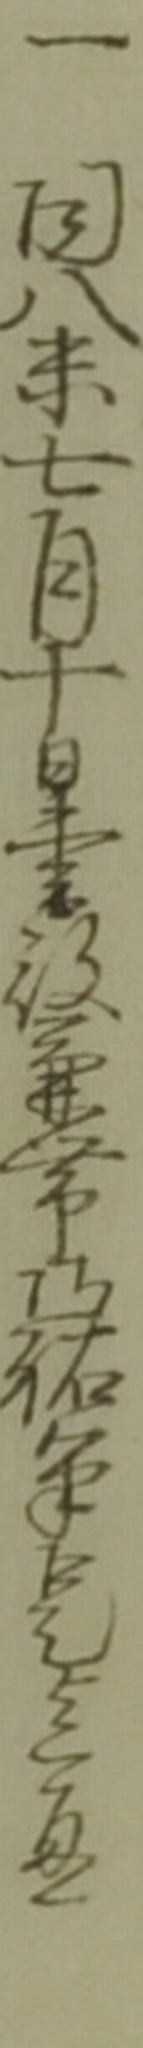一同八未七月十日書役兼帯御祐筆是迄之通
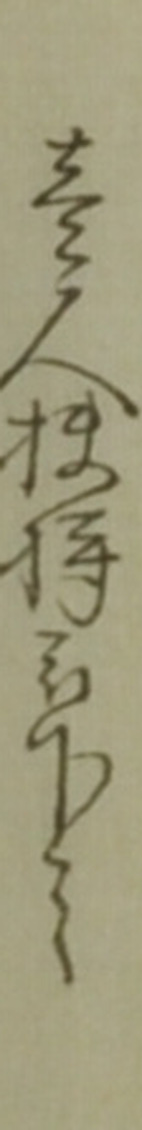壱人扶持被下之
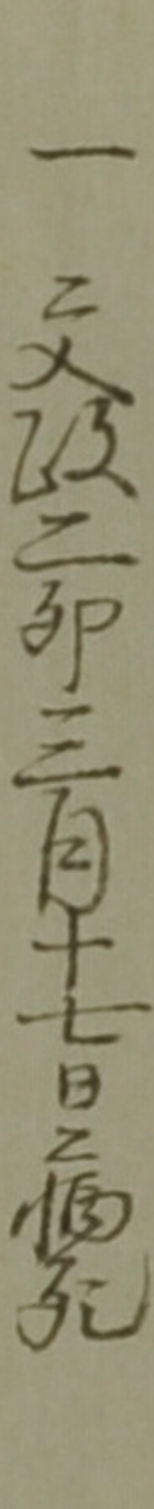一文政二卯三月十七日病死
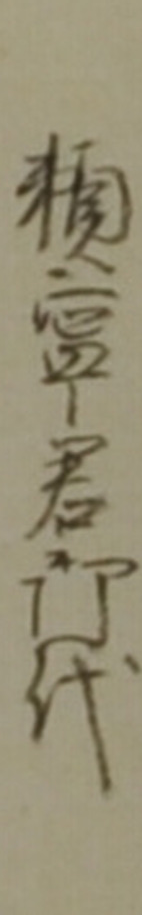頼寧君御代
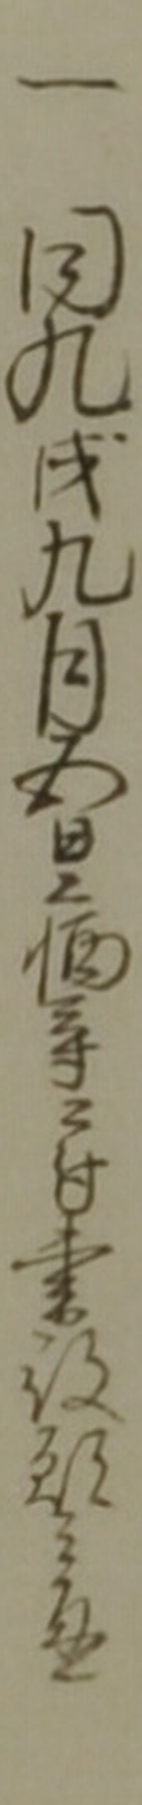一同九戌九月五日病気二付書役願之通
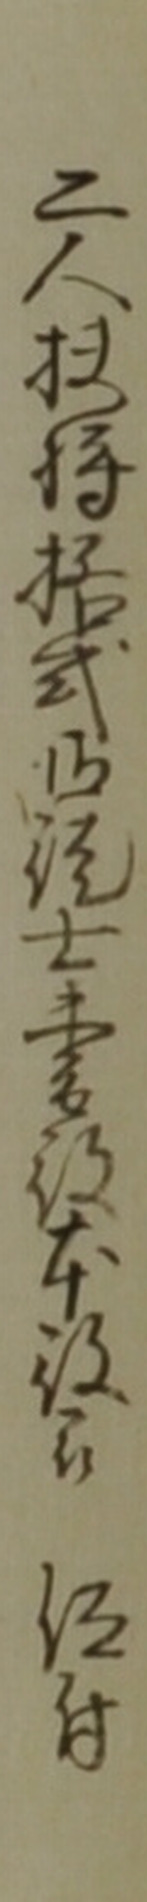二人扶持格式御徒士書役本役被仰付
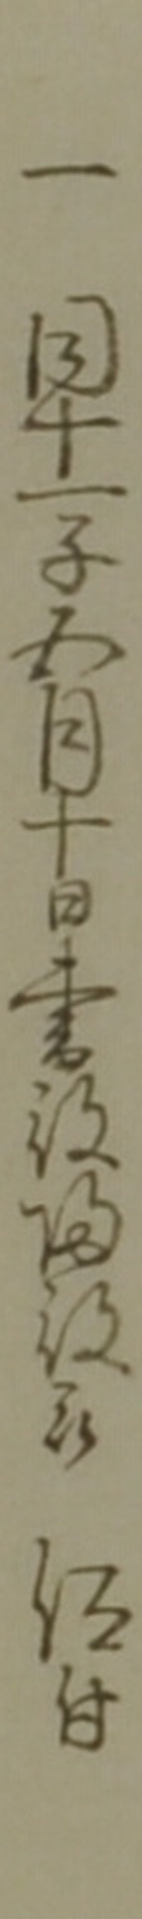一同十一子五月十日書役帰役被仰付
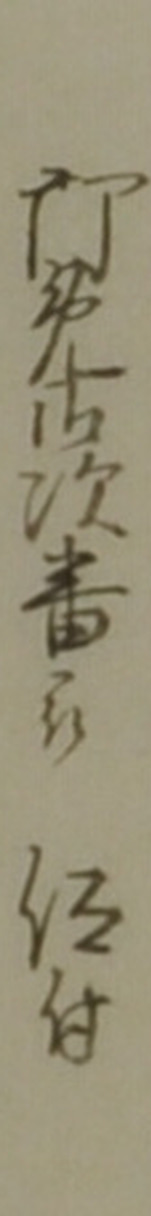御免御次番被仰付
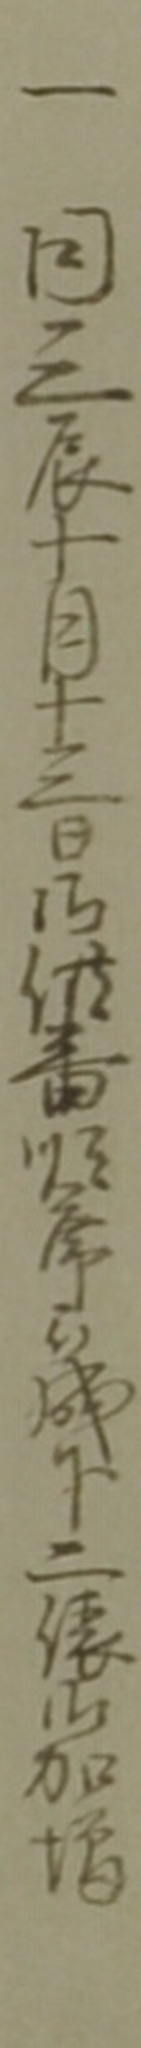一同三辰十月十三日御供番順席被成下二俵御加増
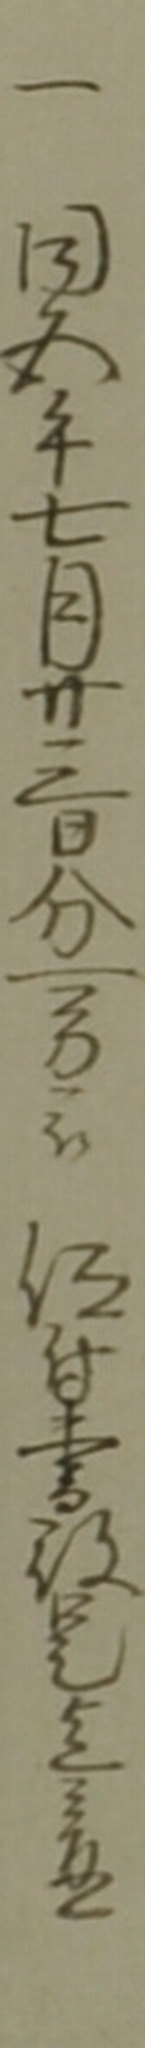一同五午七月廿三日分一方被仰付書役是迄之通
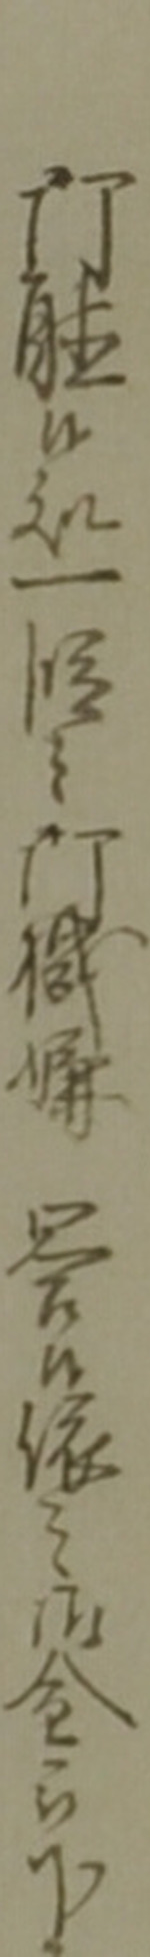御聴候処一段之御機嫌思召依之御金被下之
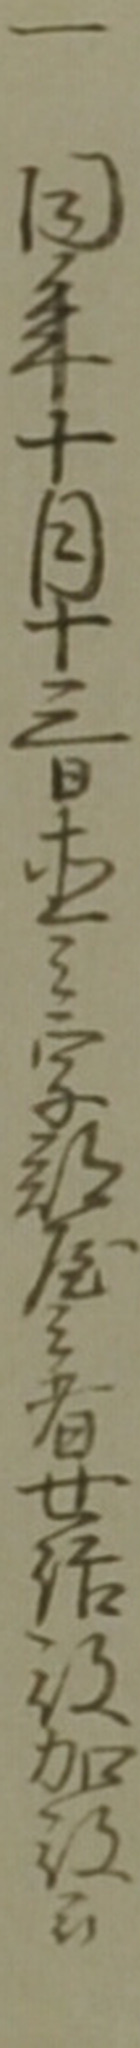一同年十月十三日直之字郡屋之者世話役加役被

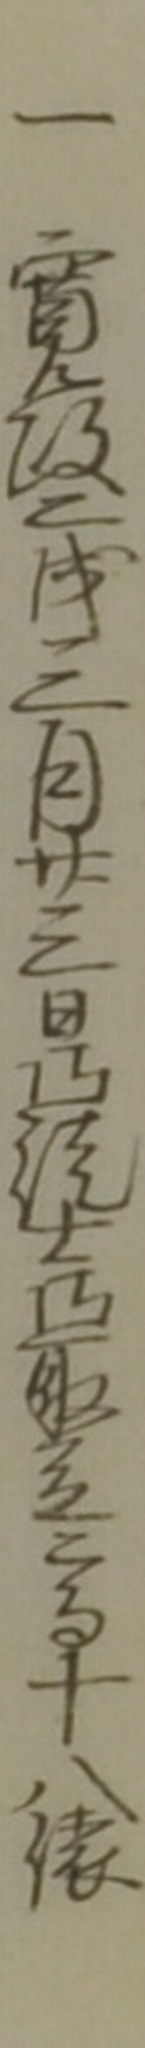一寛政二戌三月廿三日御徒士御取立高十八俵
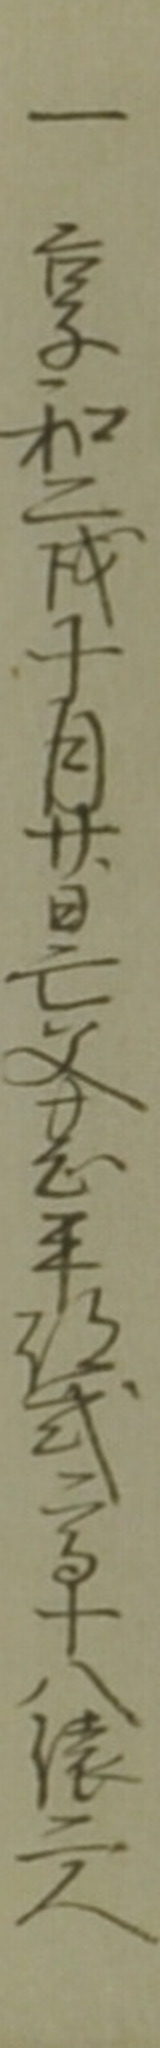一享和二戌十月廿日亡父甚平跡式高十八俵二人
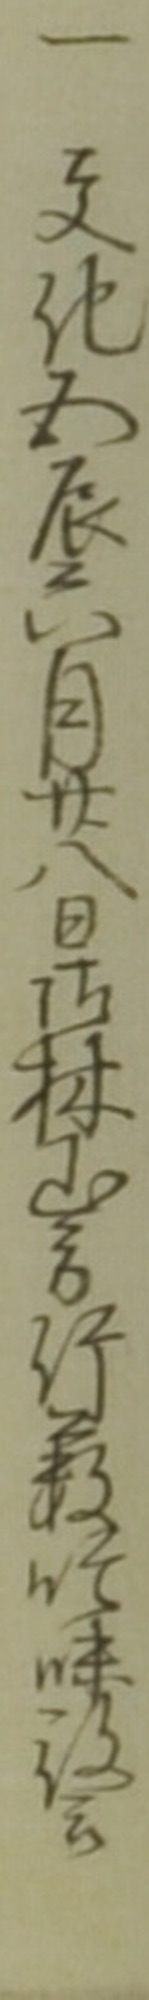一文化五辰六月廿八日御林山方竹薮吟味役被

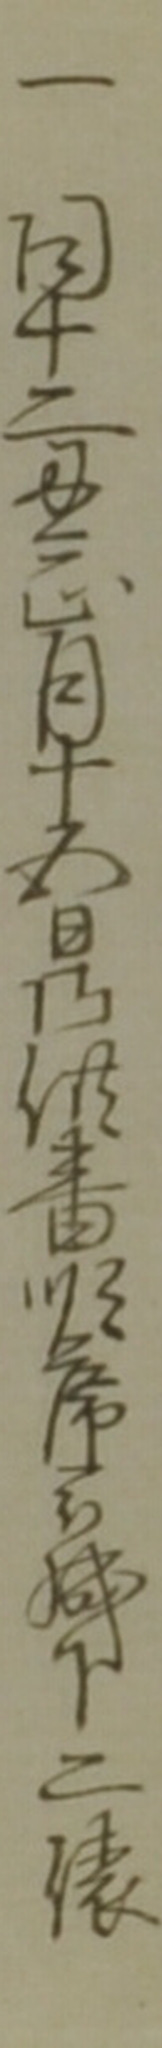一同十二丑正月十五日御供番順席被成下二俵
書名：無足諸士勤仕録（五）
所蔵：伊那市立高遠町図書館・合同会社AMANE
